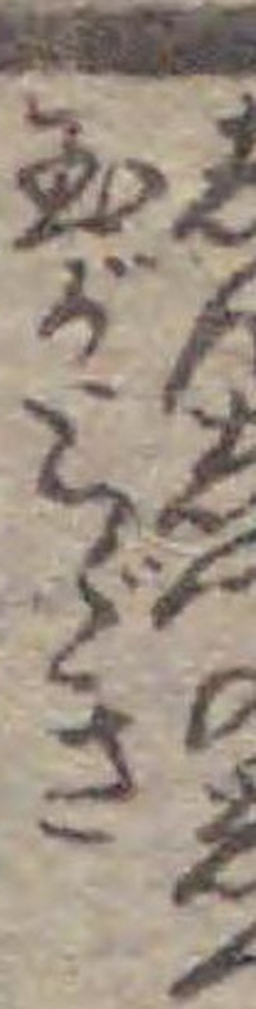玉がとゞき
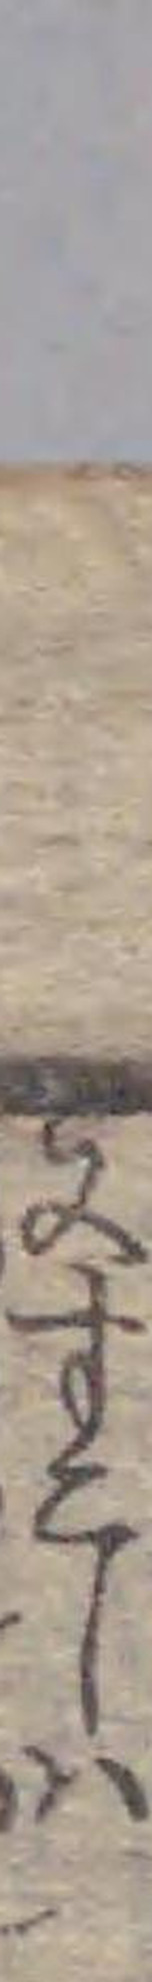又すこしは
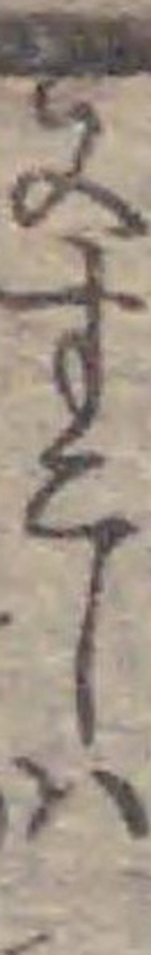又すこしは
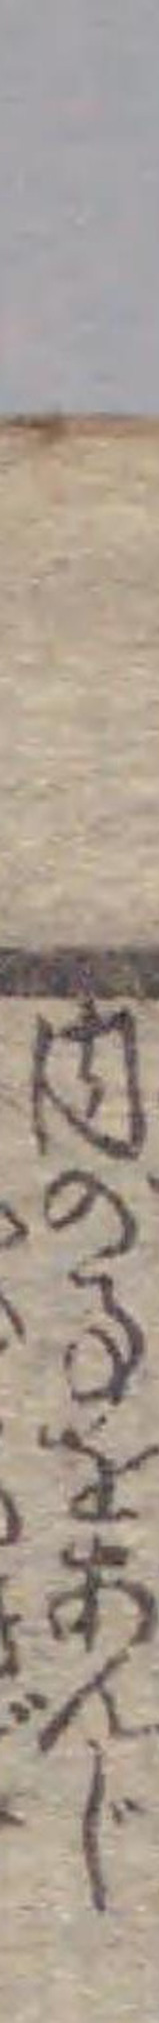内の事をあんじ
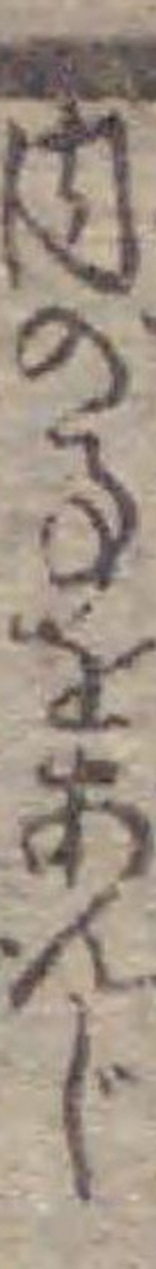内の事をあんじ
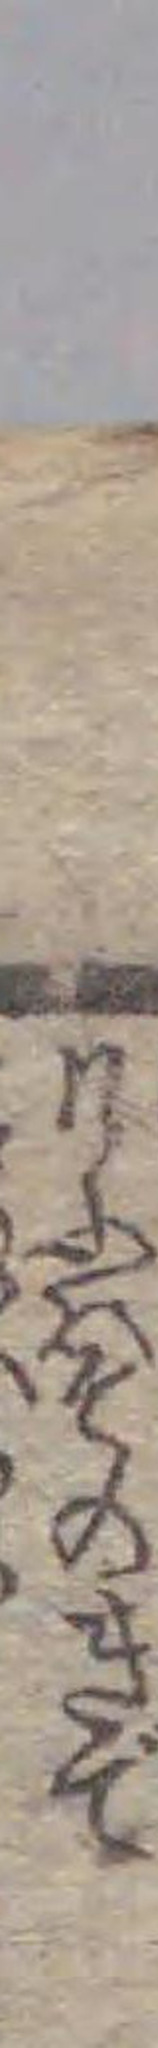けふはそのきで
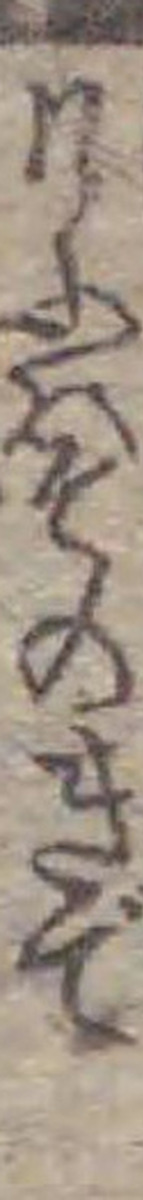けふはそのきで
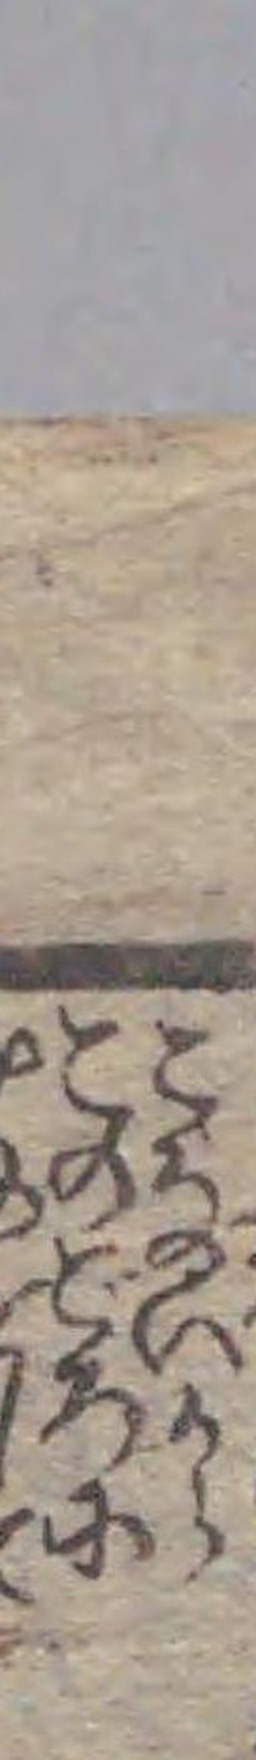このごろに
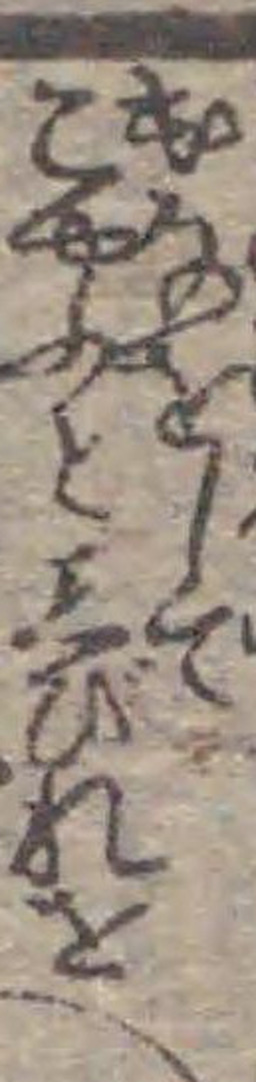こやふとしびれを
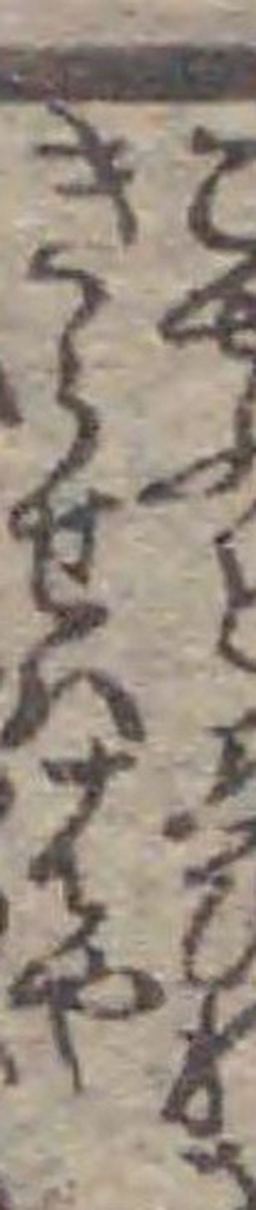きらせははや
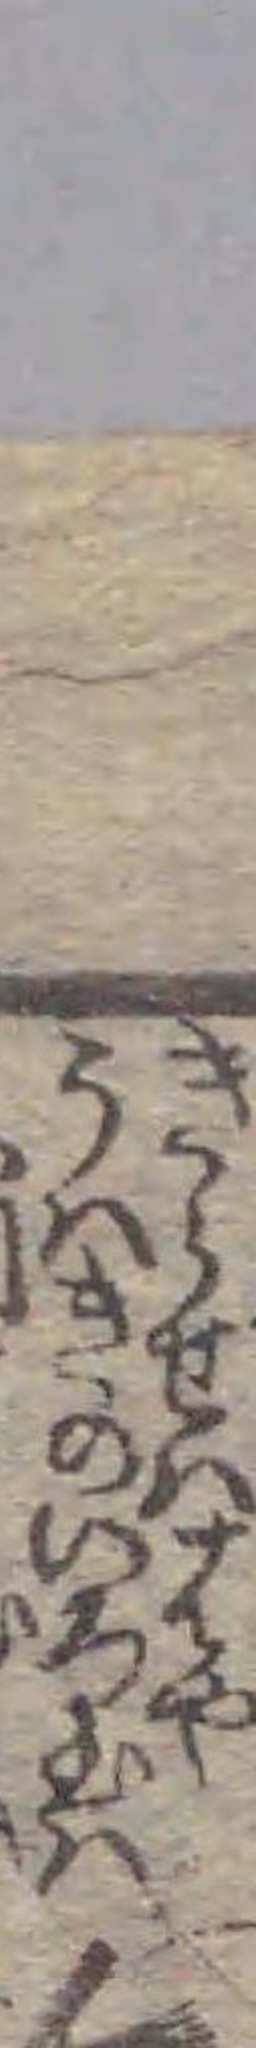うはきのいろ玉は
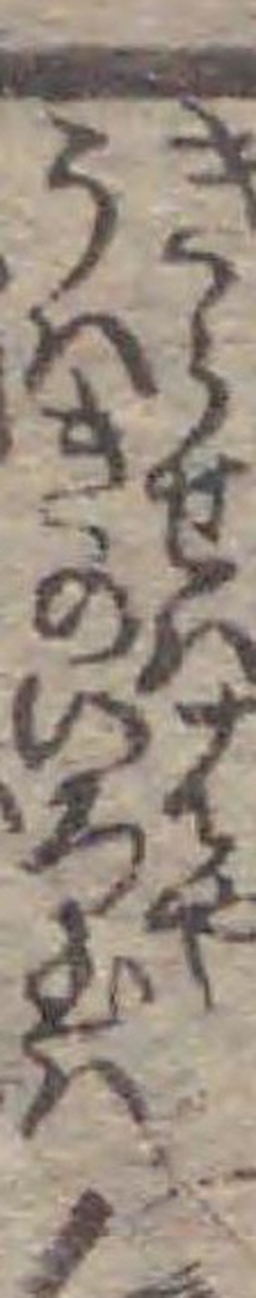うはきのいろ玉は
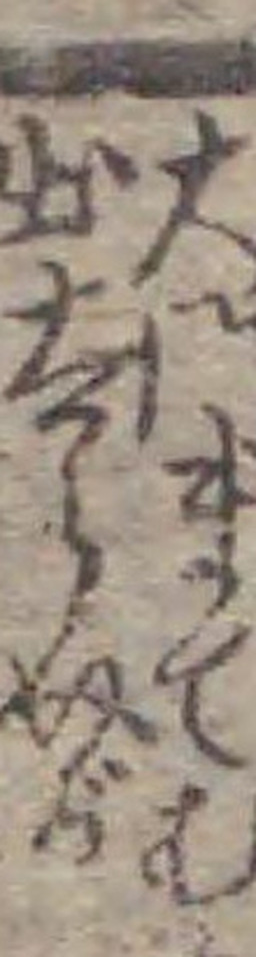出太郎介が
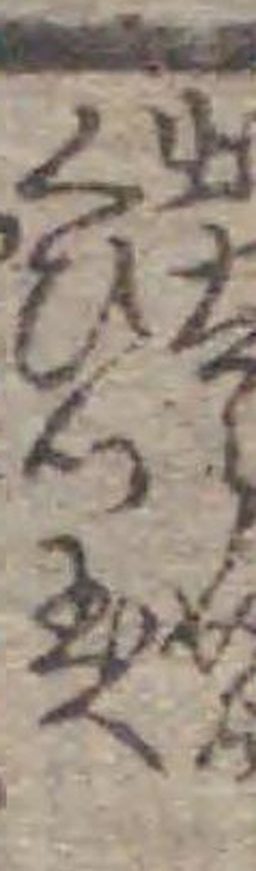くひつ玉へ
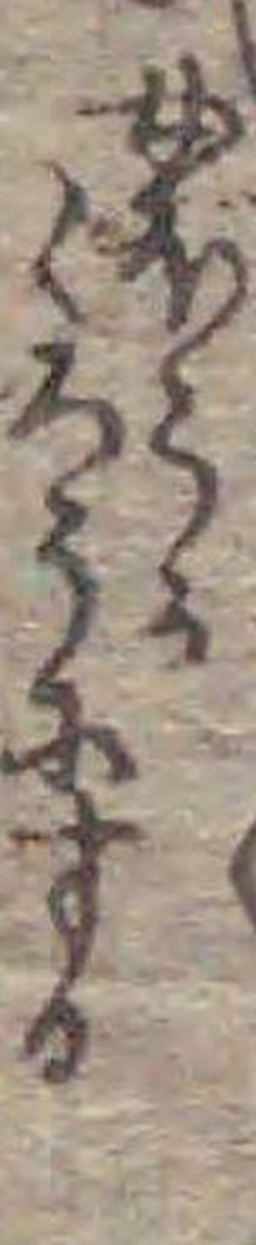くろうにする
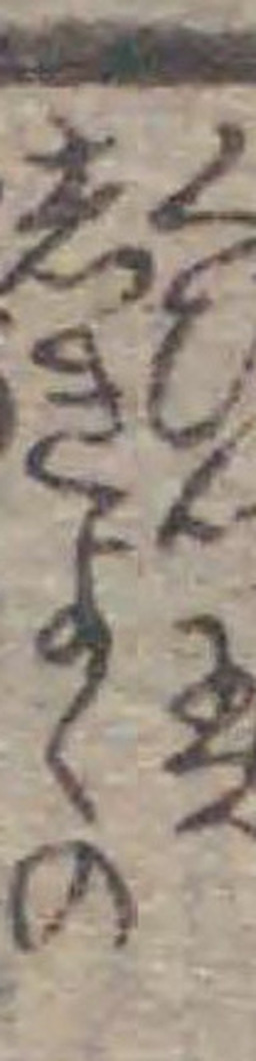しきよくの
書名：四遍搨心学草帋 : 3巻
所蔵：国立国会図書館 National Diet Library, JAPAN
